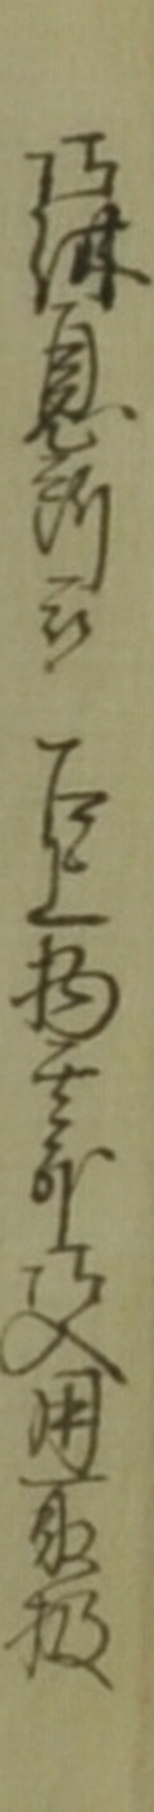御休息所被召上物其外御入用取扱
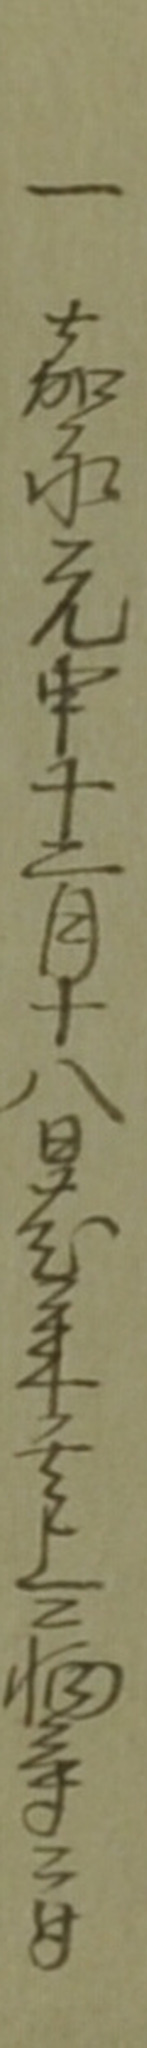一嘉永元申十二月十八日老年其上病気ニ付
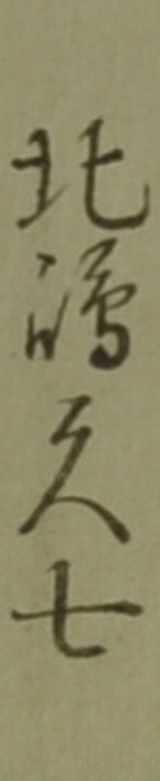北嶋久七
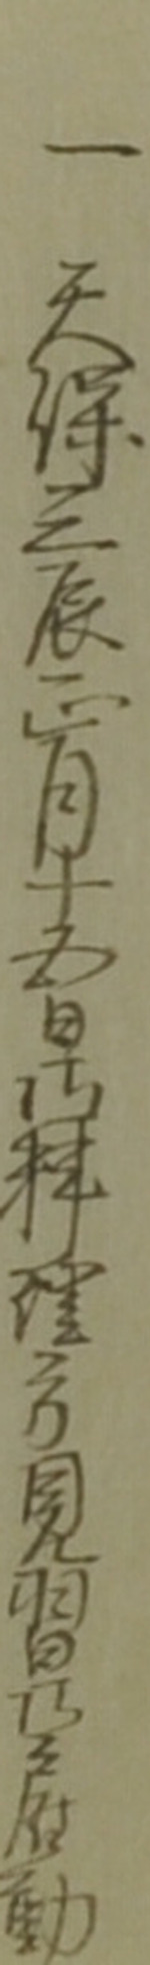一天保三辰正月十五日御料理方見習御雇勤
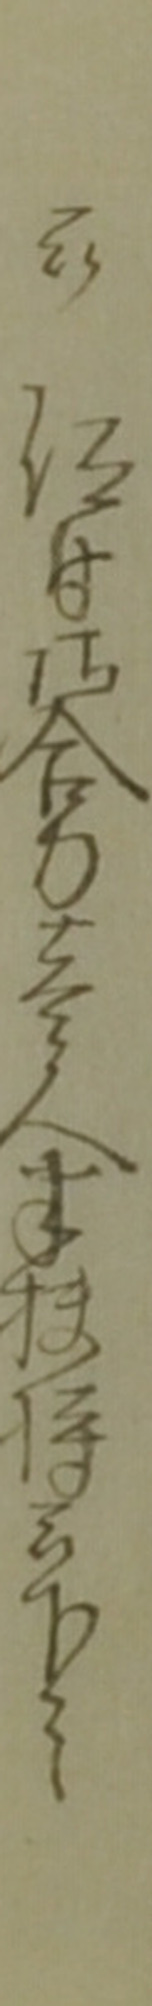被仰付御合力壱人半扶持被下之
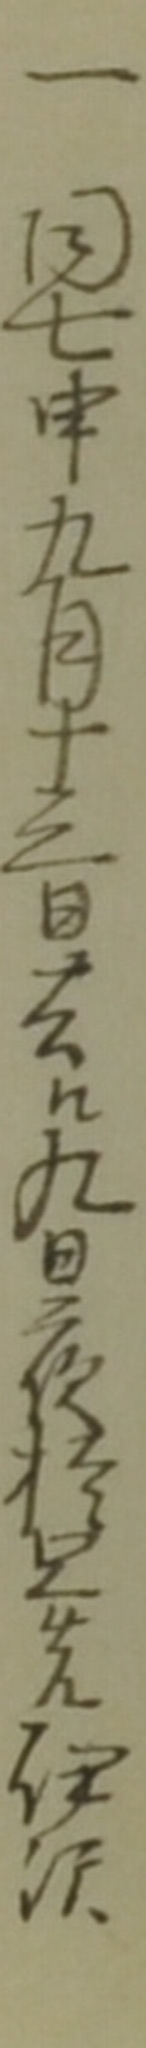一同七申九月十三日去ル九日夜於廻先伊沢
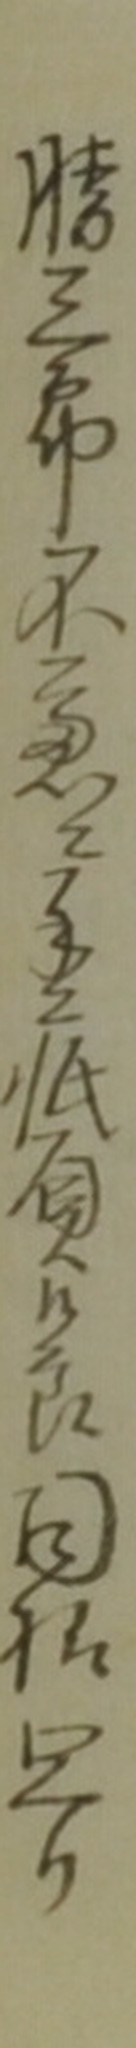勝三郎不慮ニ手疵負候節同様廻リ
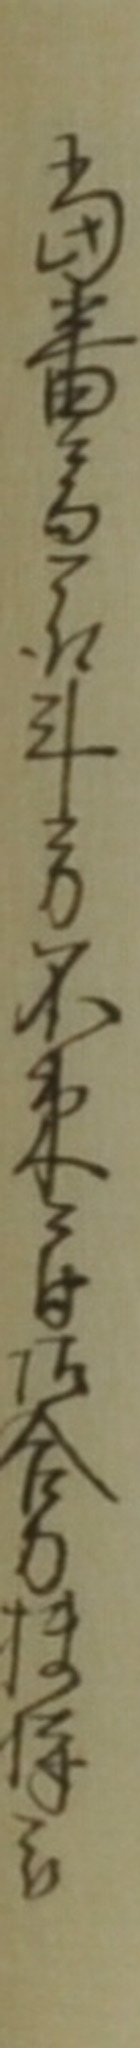当番ニ而取計方不束ニ付御合力扶持被
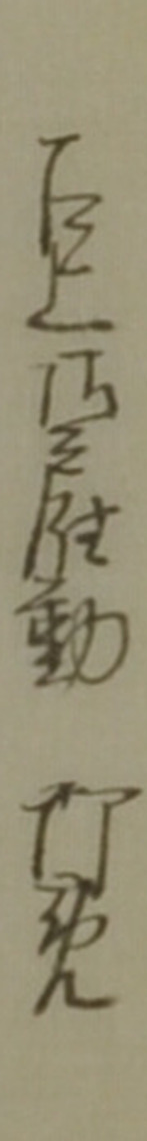召上御雇勤御免
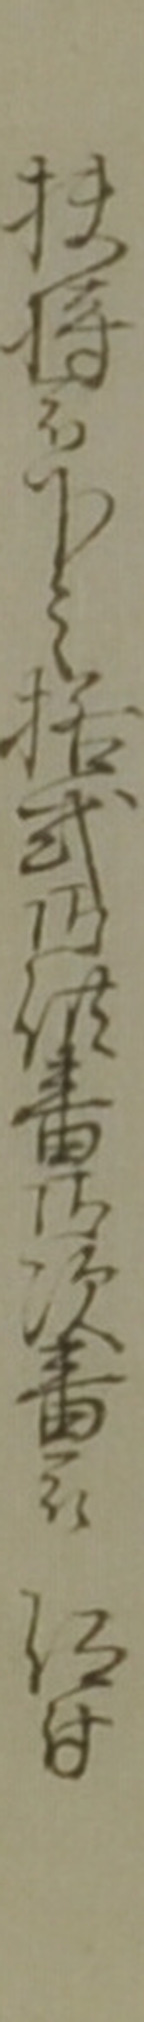扶持被下之格式御供番御次番被仰付
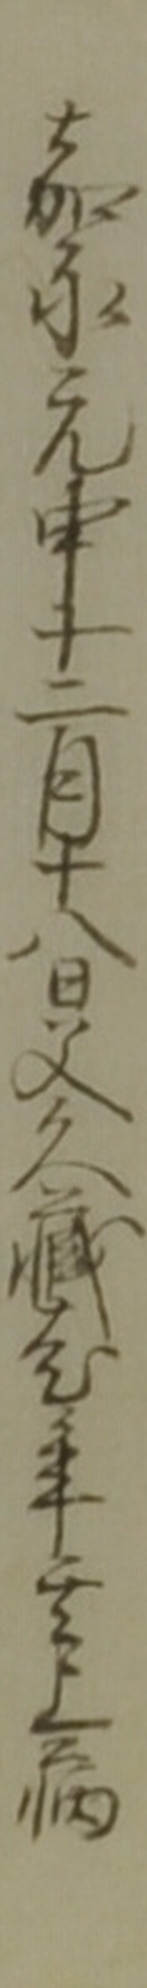一嘉永元申十二月十八日父久蔵老年其上病
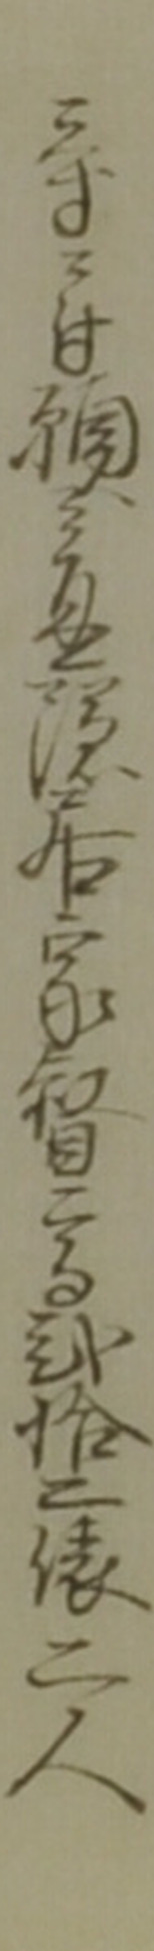気ニ付願之通隠居家督高弐拾二俵二人
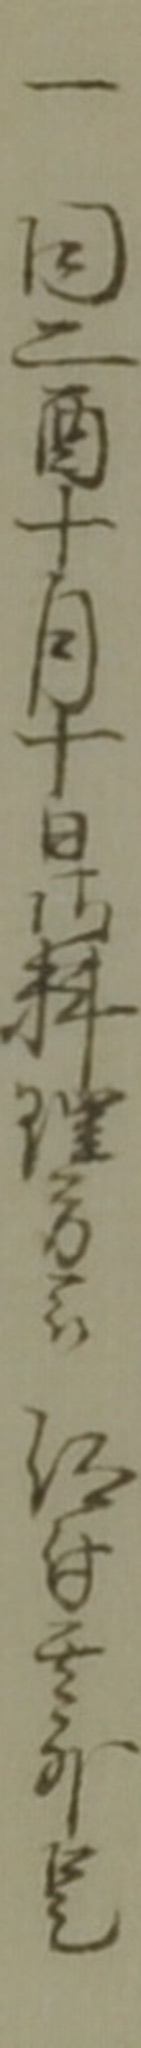一同二酉十月十日御料理方被仰付其外是
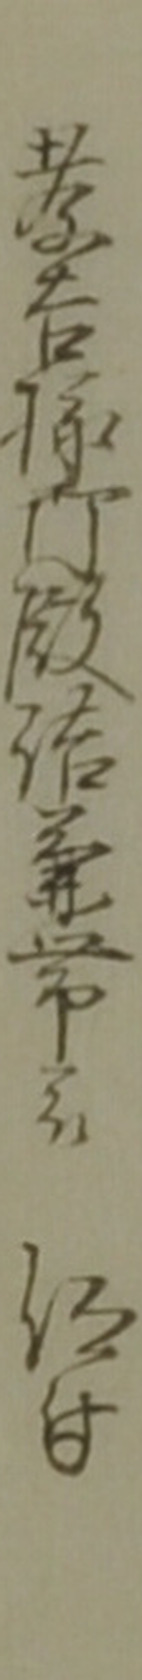孝吉様御殿詰兼帯被仰付
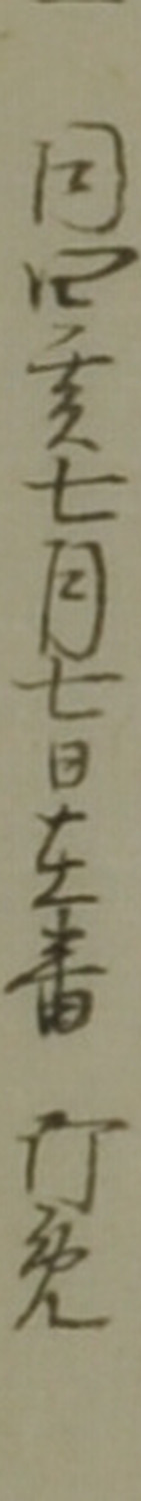一同四亥七月七日在番御免

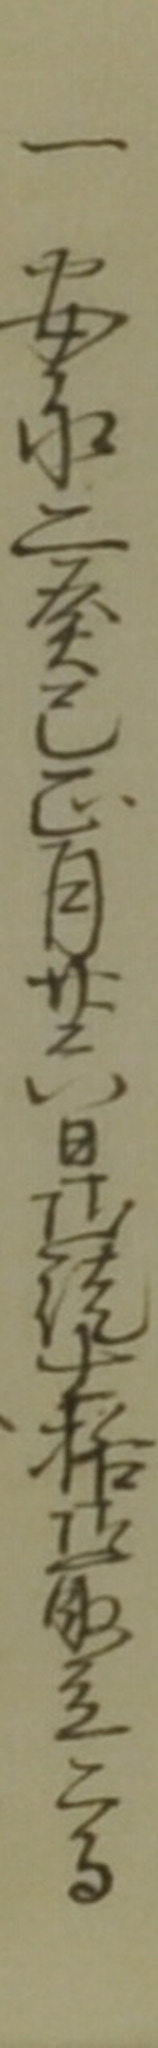一安永二癸巳正月廿六日御徒士格御取立高
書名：無足諸士勤仕録（五）
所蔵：伊那市立高遠町図書館・合同会社AMANE
